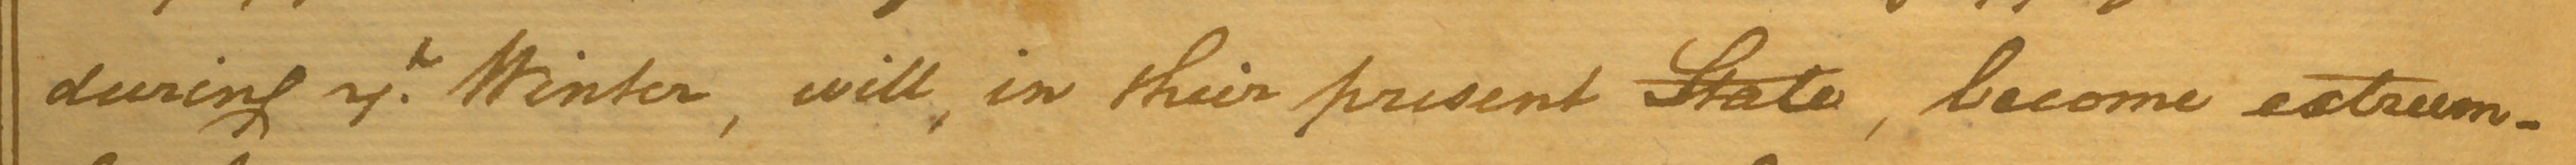during y^e. Winter, will in their present State, become extreem-
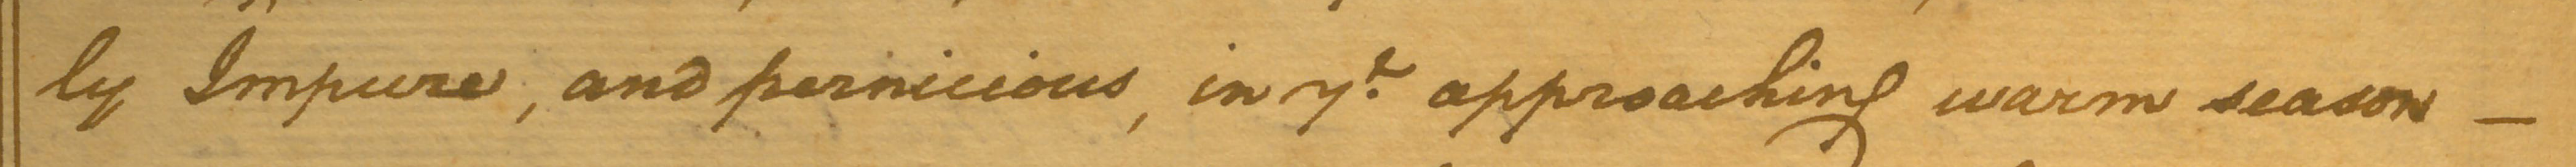ly Impure, and pernicious, in y^e. approaching warm season-
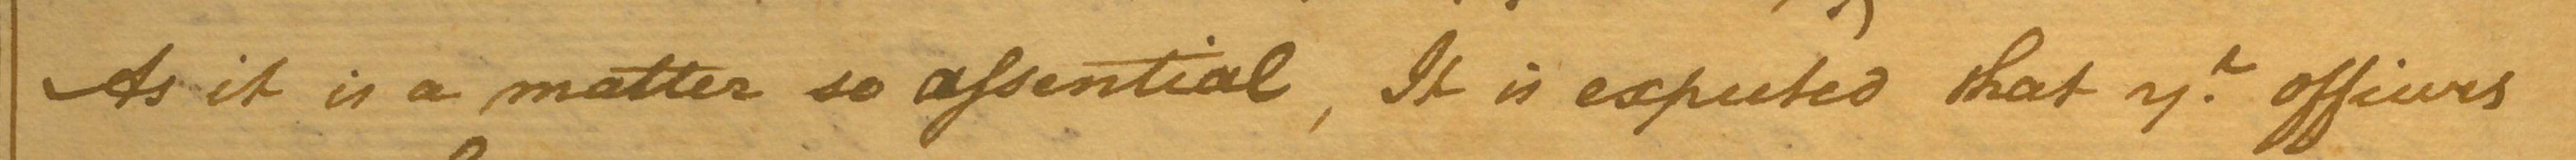As it is a matter so assential, It is expected that y^e. officers
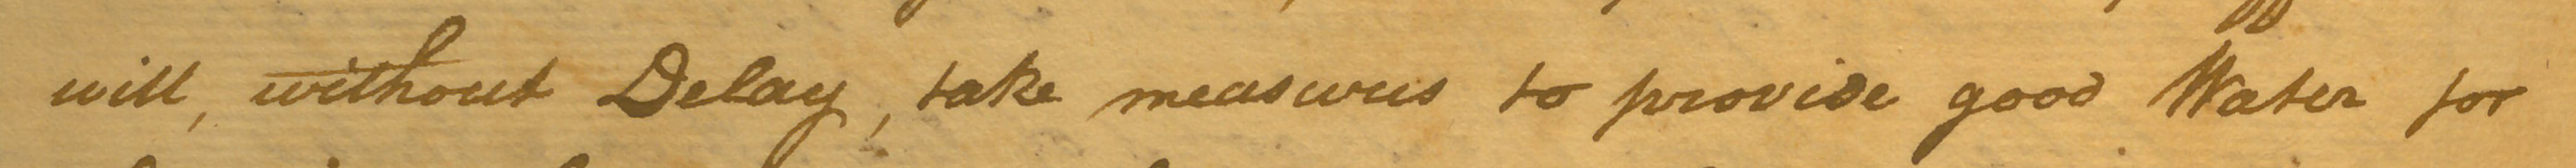will, without Delay, take measures to provide good Water for
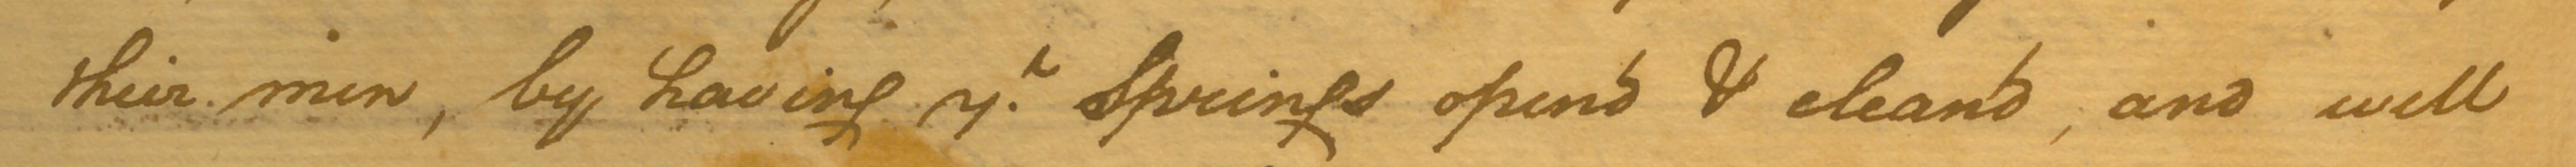their men, by having y^e. Springs open'd & clean'd and well
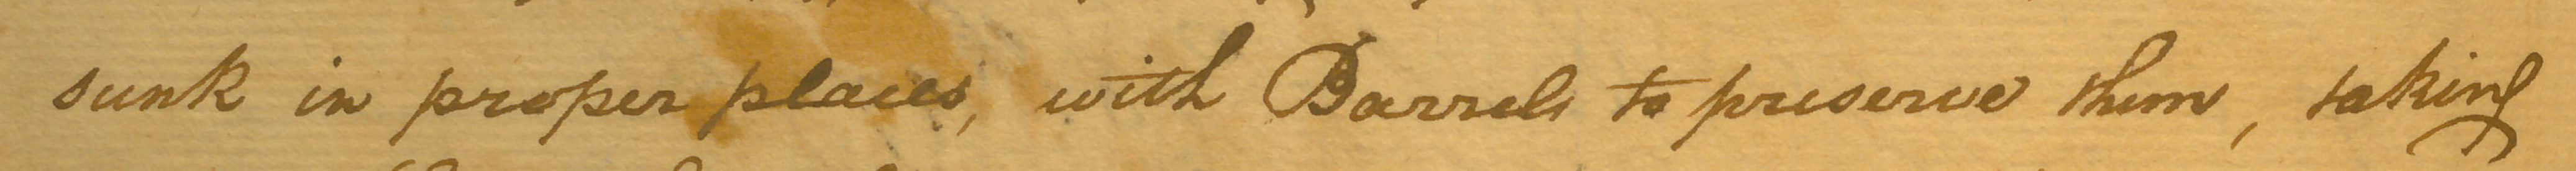sunk in proper places, with Barrels to preserve them, taking
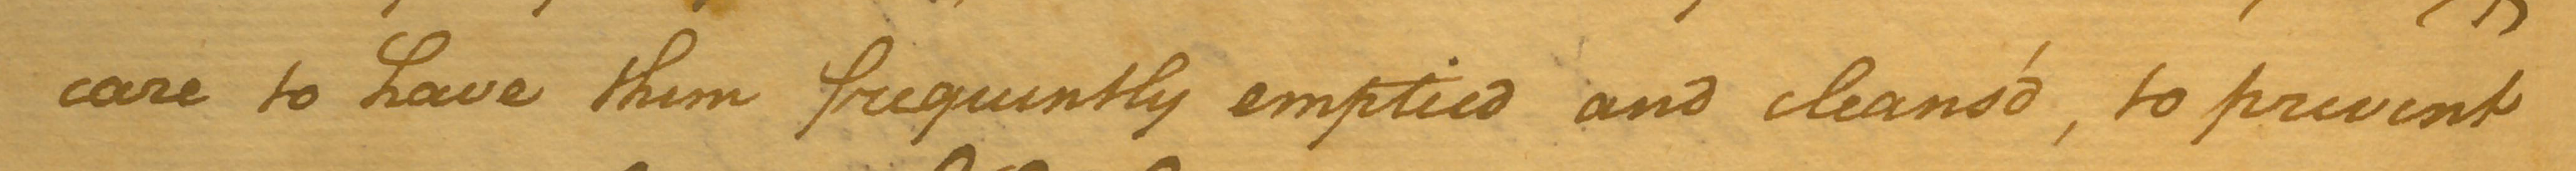care to have them frequently emptied and cleans'd, to prevent
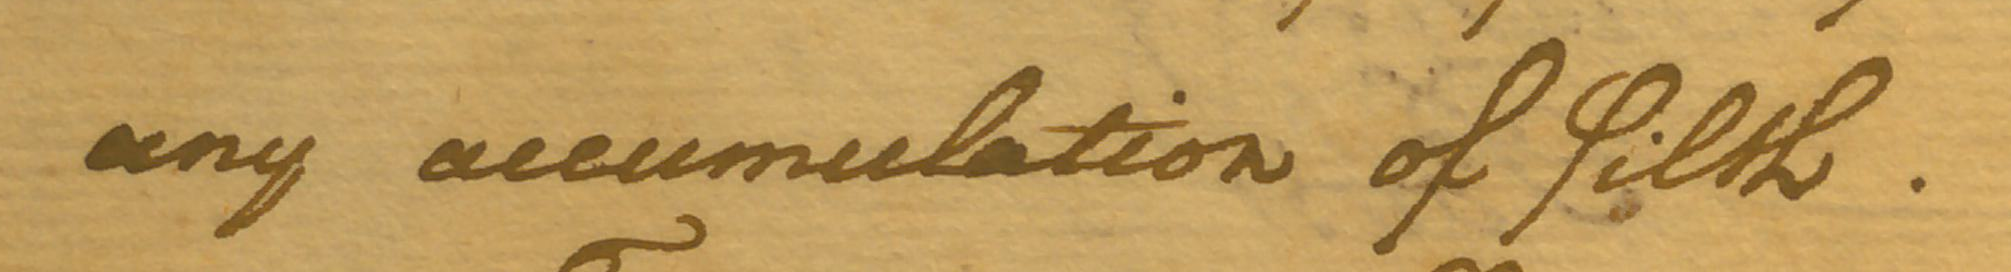any accumulation of filth.
